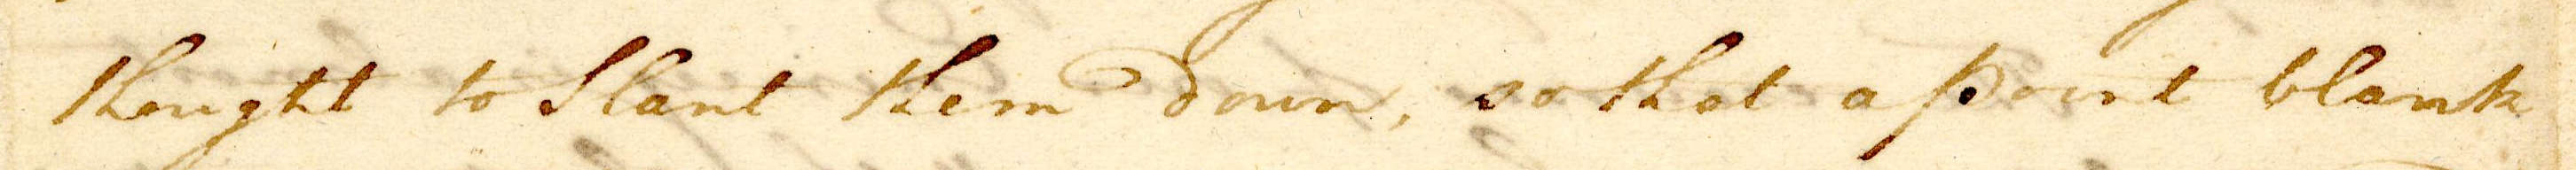thought to Slant them down, so that a point blank
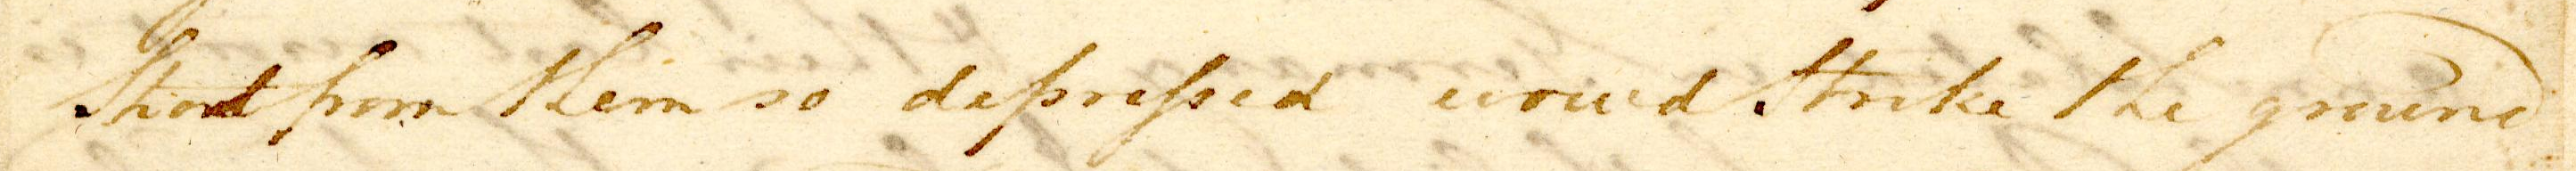Shot from them so depressed would Strike the ground
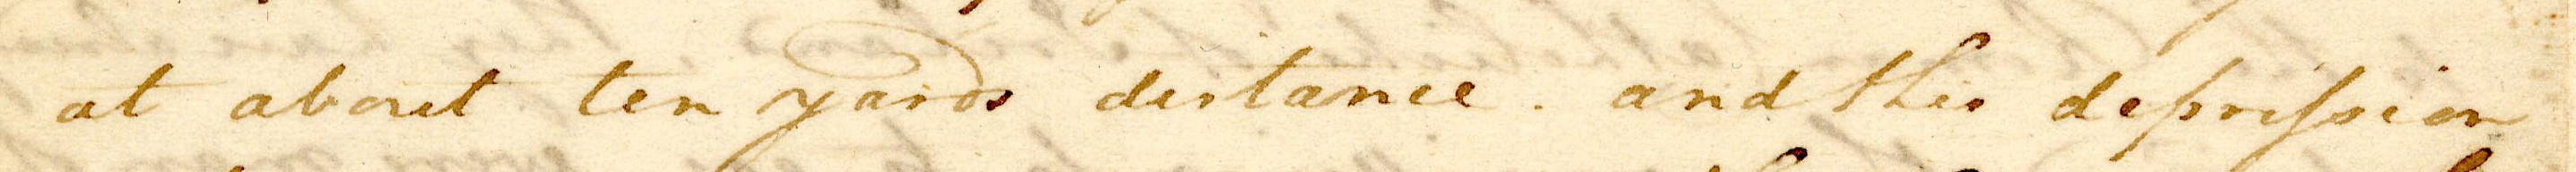at about ten yards distance; and this depression
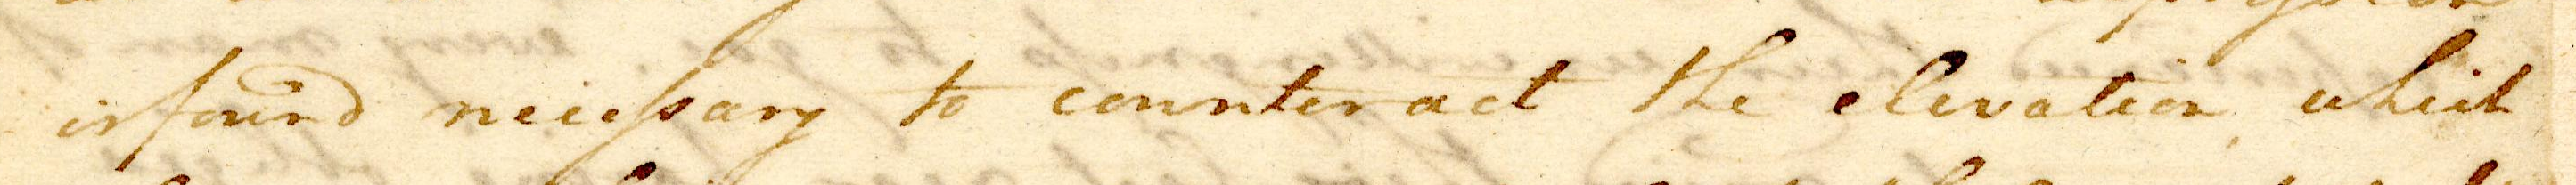is found necessary to counteract the elevation which
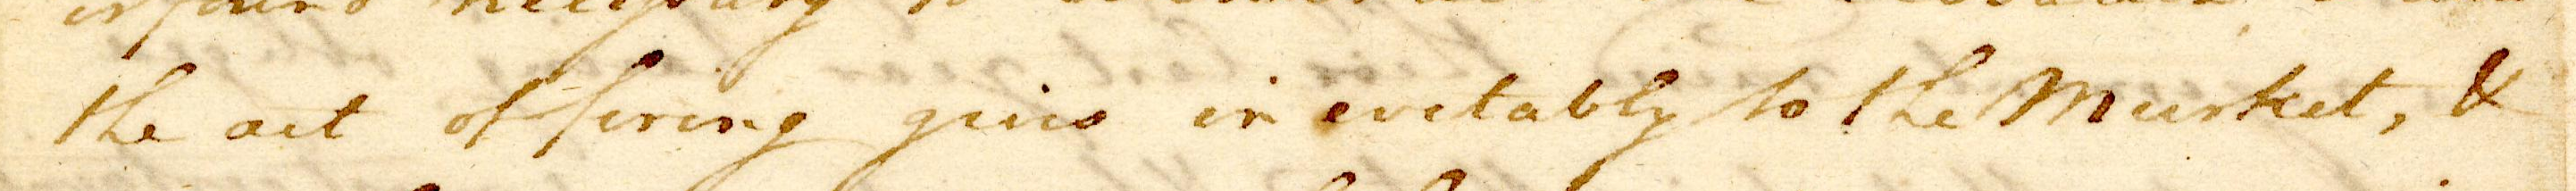the act of firing gives inevitably to the musket, &
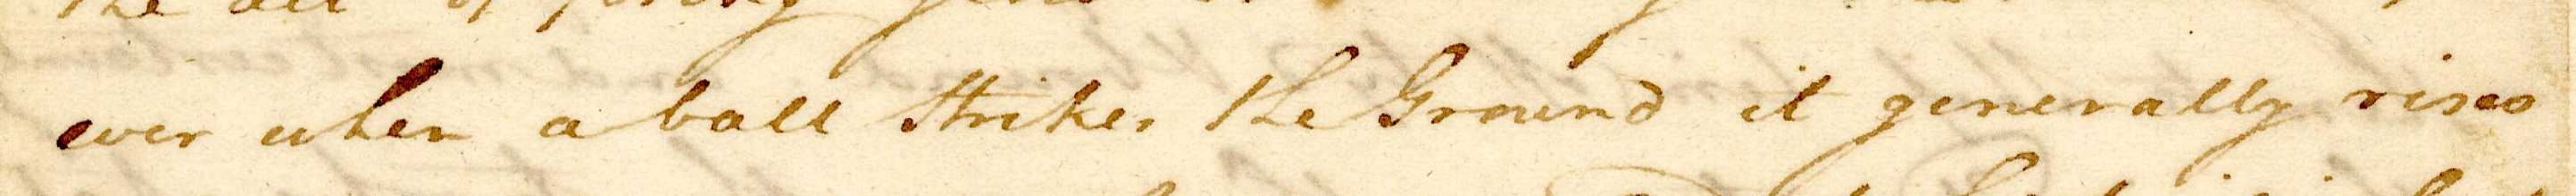ever when a ball Strikes the Ground it generally rises
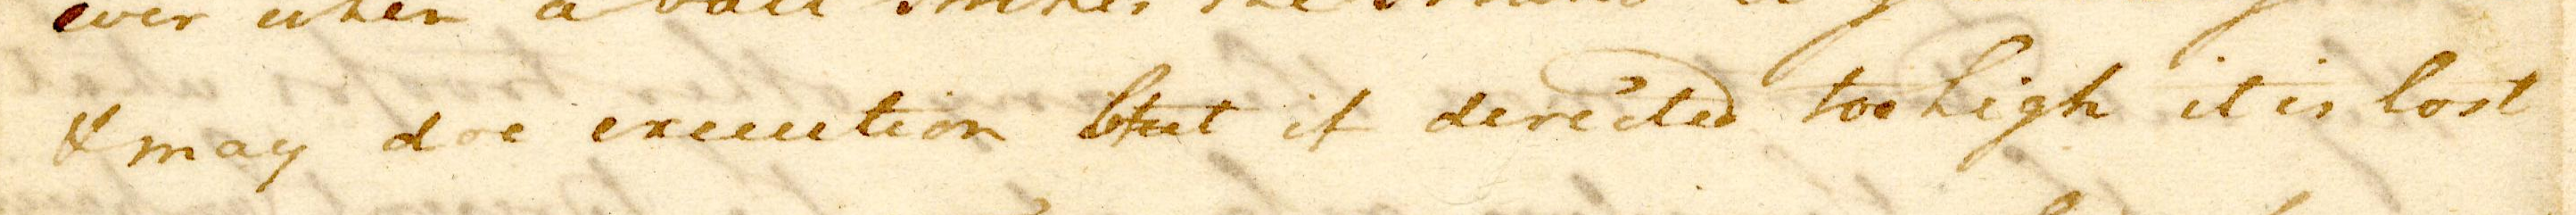& may doe execution but if directed too high it is lost
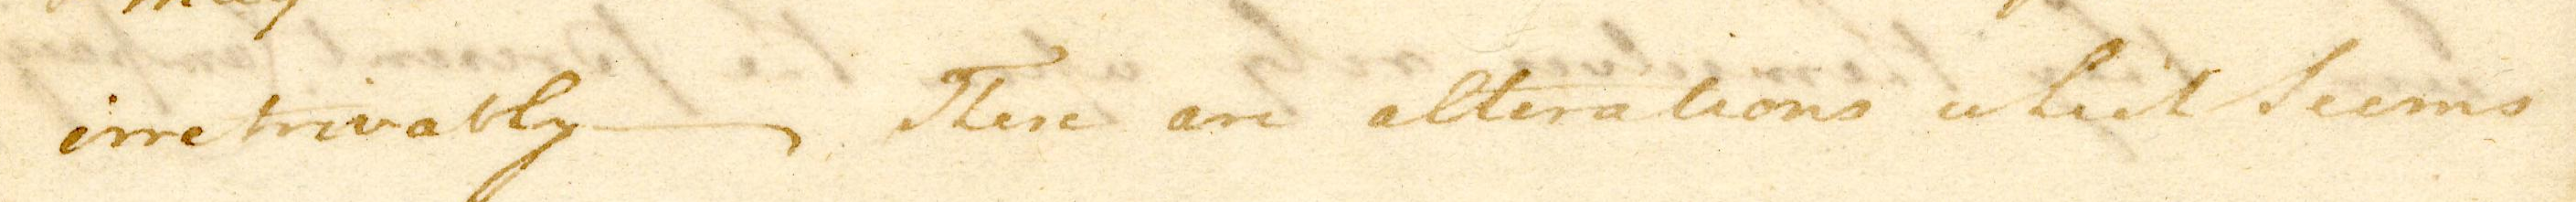irretrievably- These are alterations which seems
